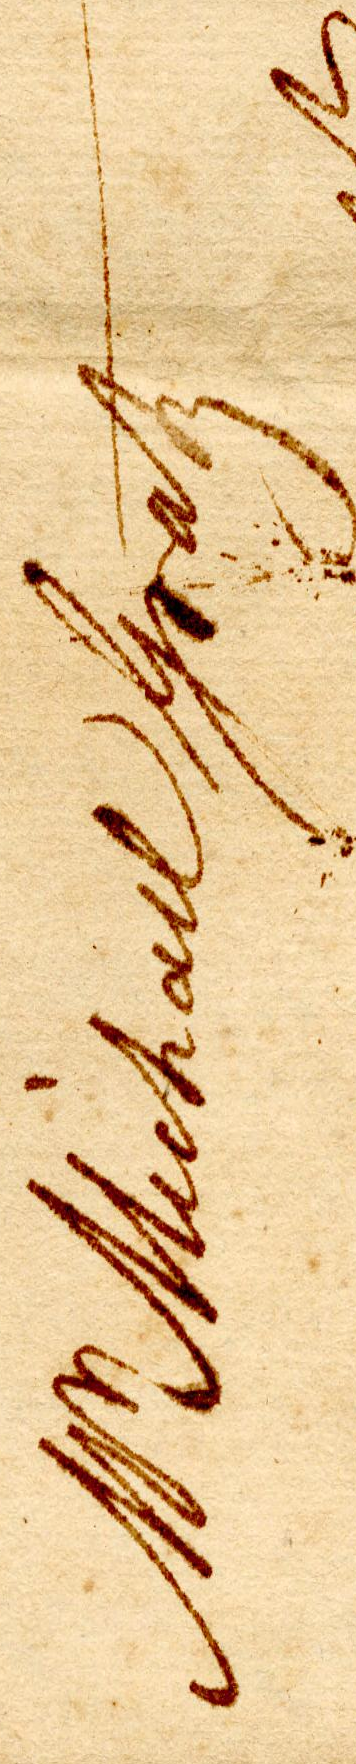M^r Michael Gratz
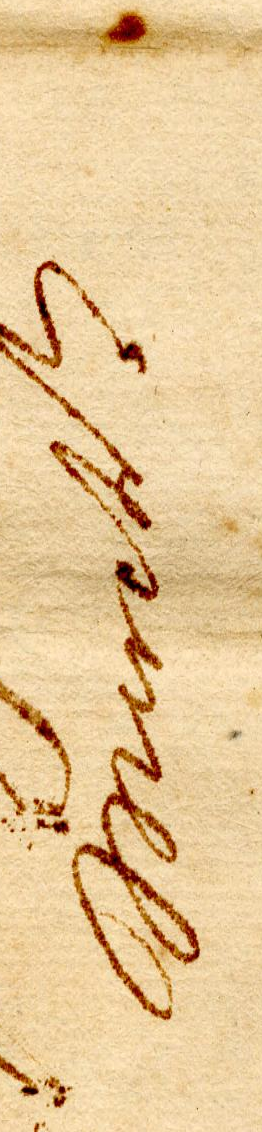Merch^t
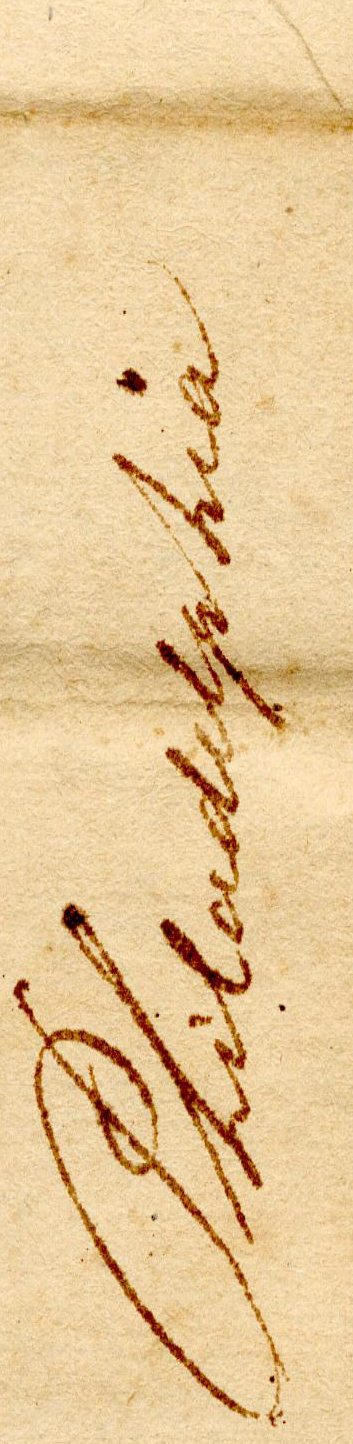Philadelphia
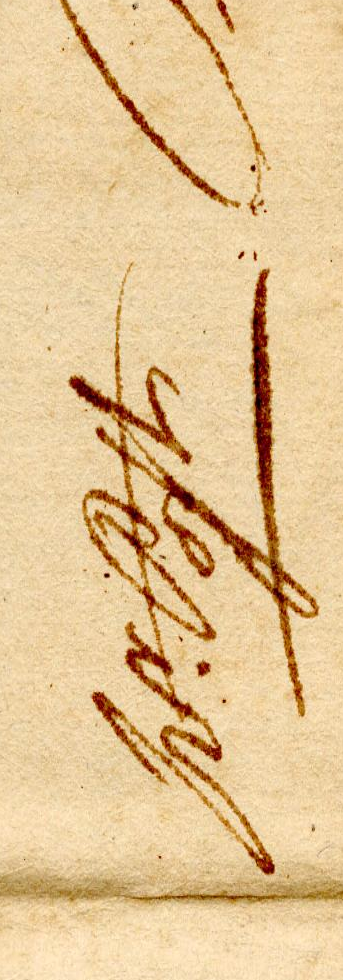p^r. Post
